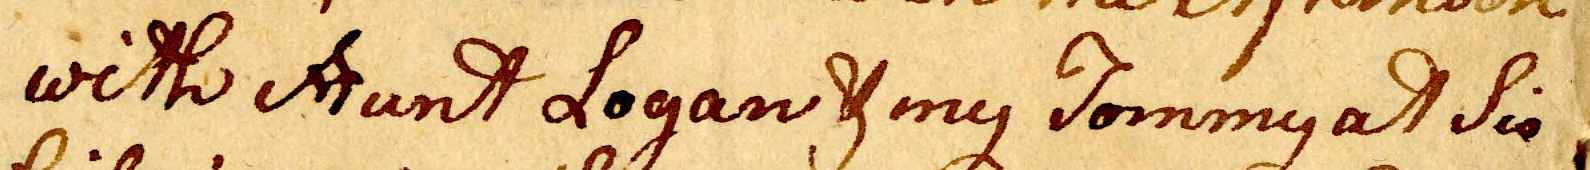with Aunt Logan & my Tommy at Sis
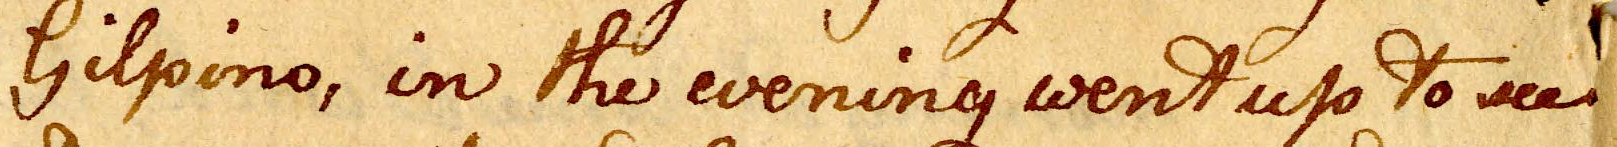Gilpins, in the evening went up to see
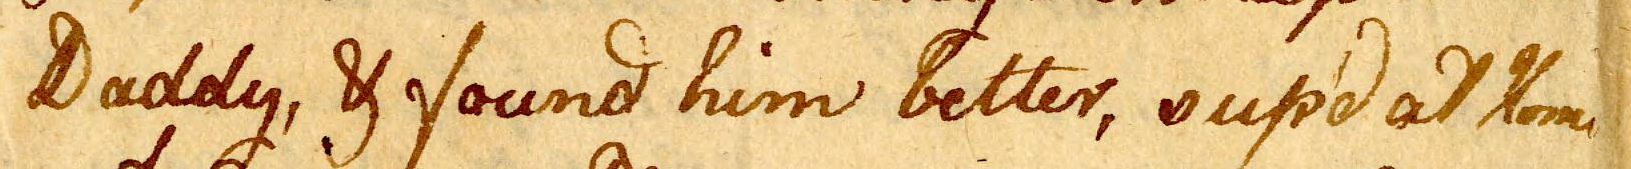Daddy, & found him better, sup'd at Home
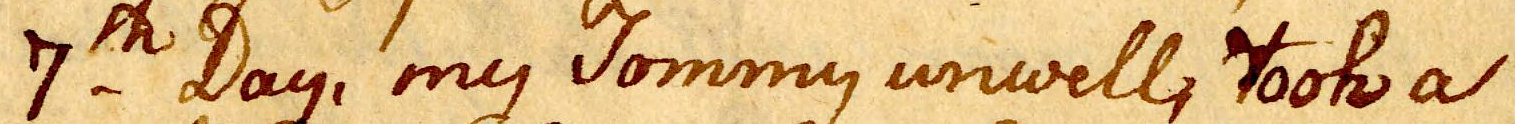7^th Day, my Tommy unwell, took a
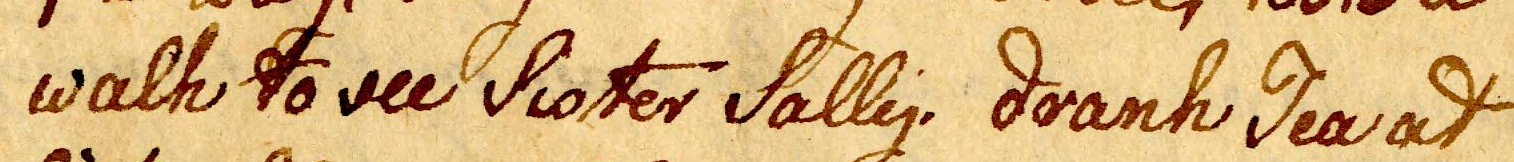walk to see Sister Sally. drank Tea at
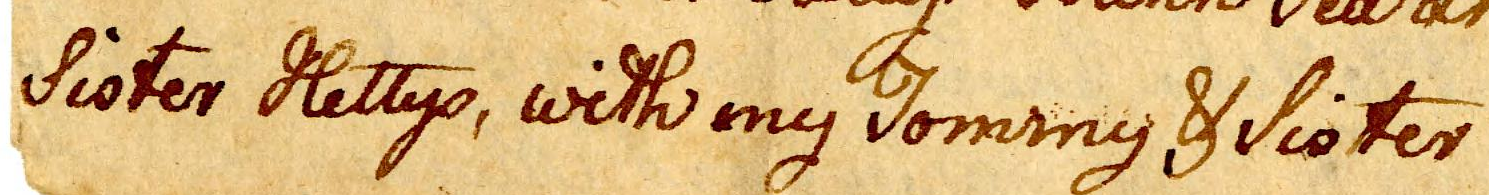Sister Hettys, with my Tommy & Sister
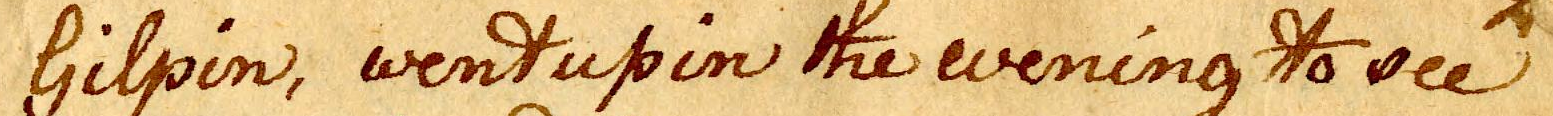Gilpin, went up in the evening to see
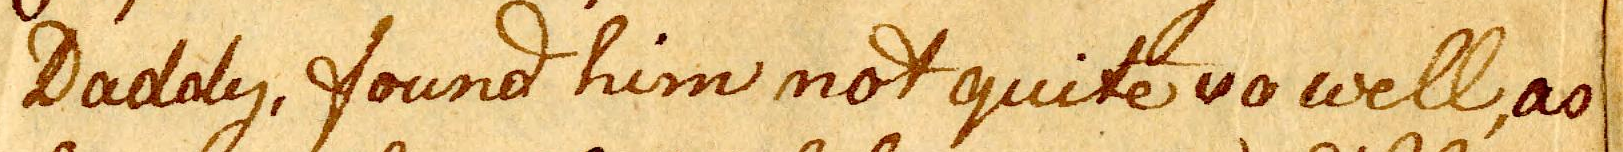Daddy, found him not quite so well, as
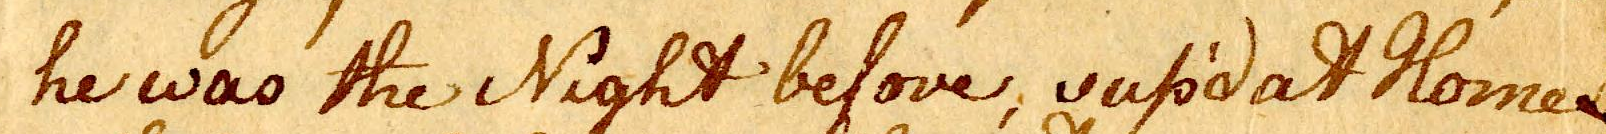he was the Night before, sup'd at Home
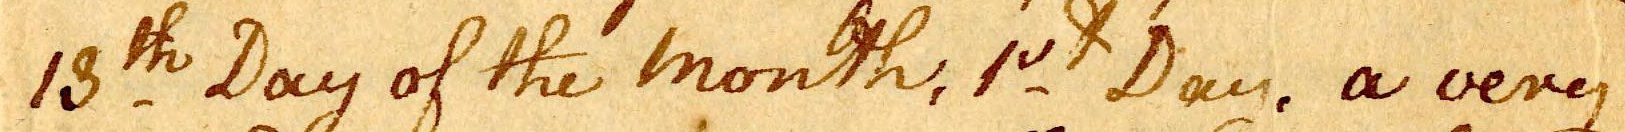13^th Day of the Month, 1^st Day, a very
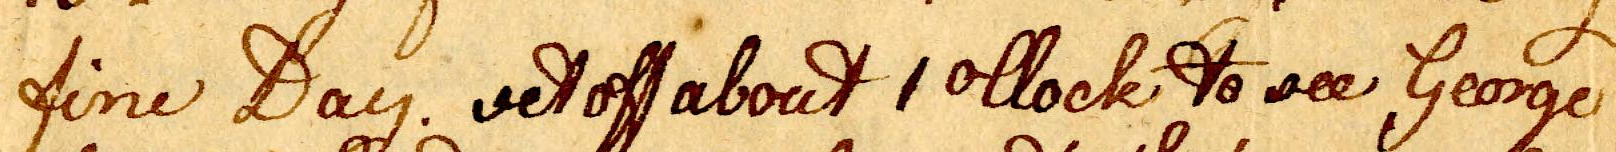fine Day. set off about 1 ^oClock to see George
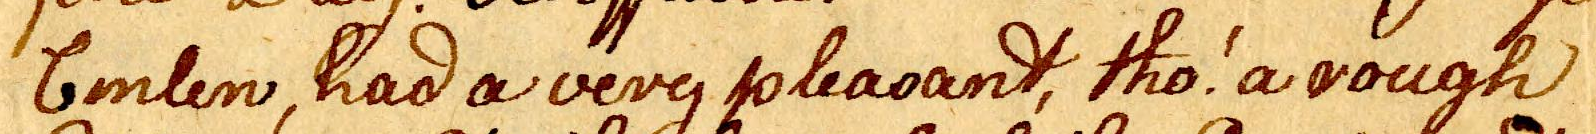Emlen, had a very pleasant, tho' a rough
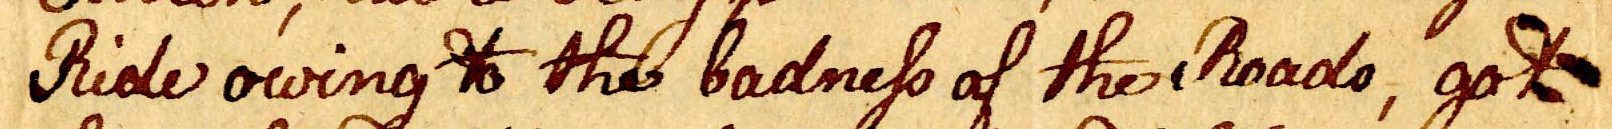Ride owing to the badness of the Roads, got
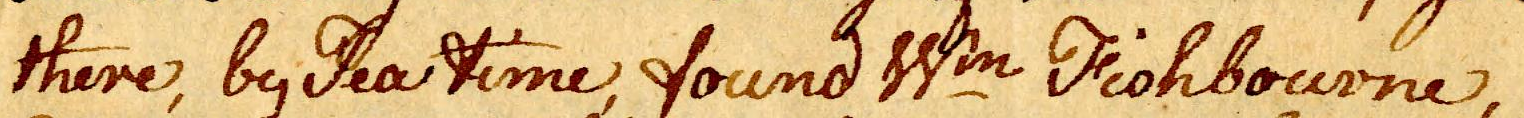there, by Tea time, found W^m Fishbourne
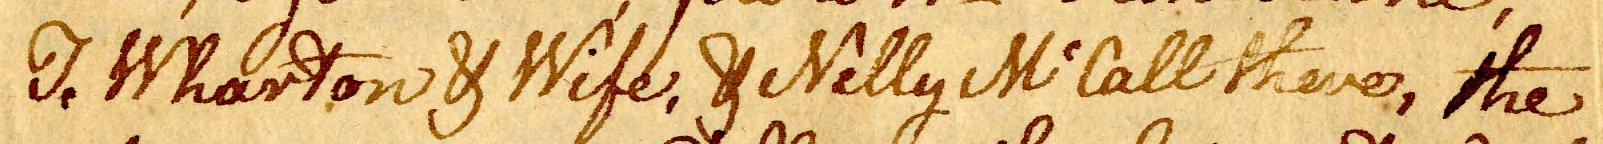T. Wharton & Wife, & Nelly M^c Call there, the
